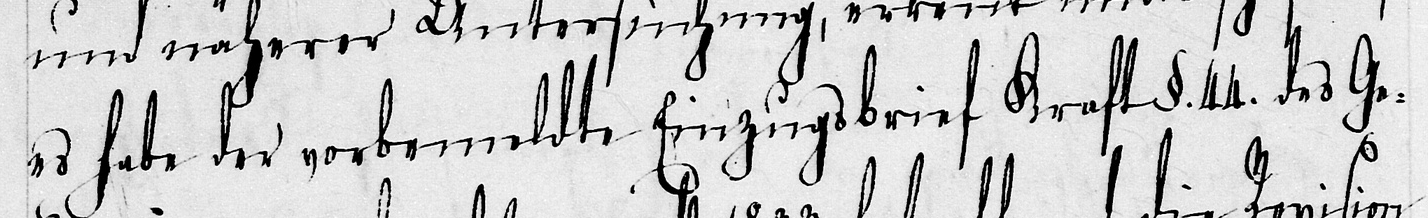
es habe der vorbemeldte Einzugsbrief Kraft §. 44. des G¬
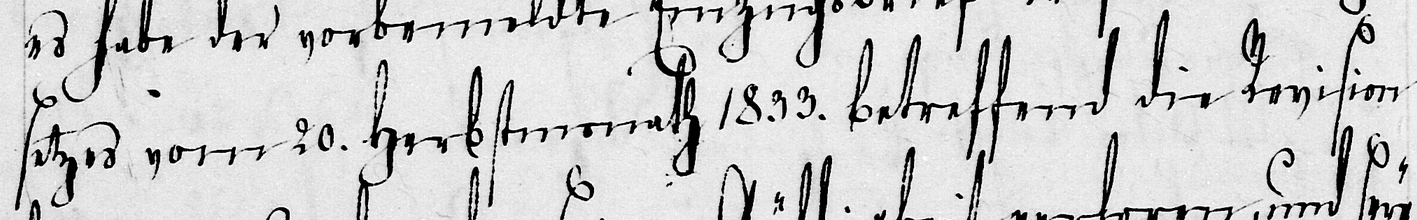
etzes vom 20. Herbstmonath 1833. betreffend die Revision
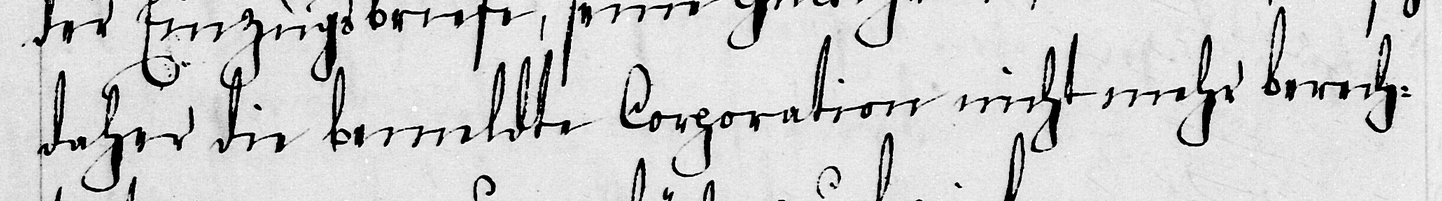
daher die bemeldte Corporation nicht mehr berech¬
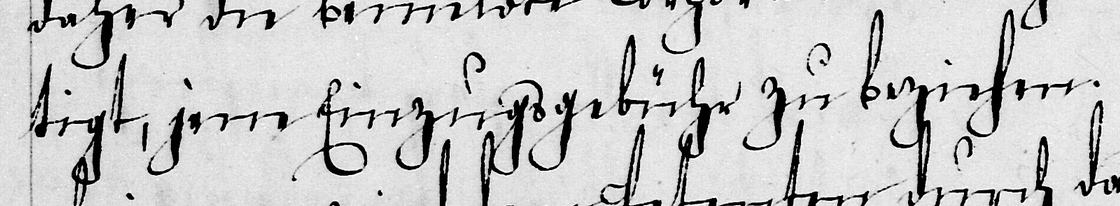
tigt, jene Einzugsgebühr zu beziehen.
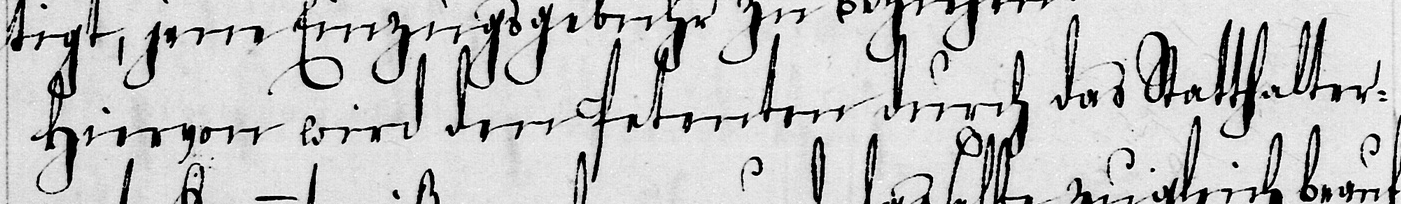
Hiervon wird den Petenten durch das Statthalter¬
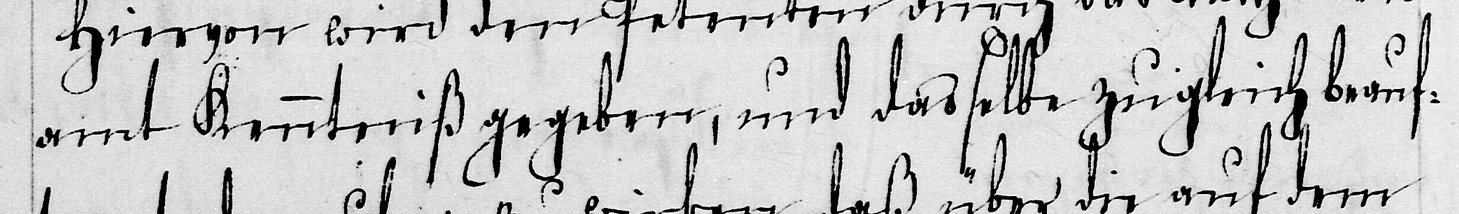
amt Kenntniß gegeben, und dasselbe zugleich beauf¬
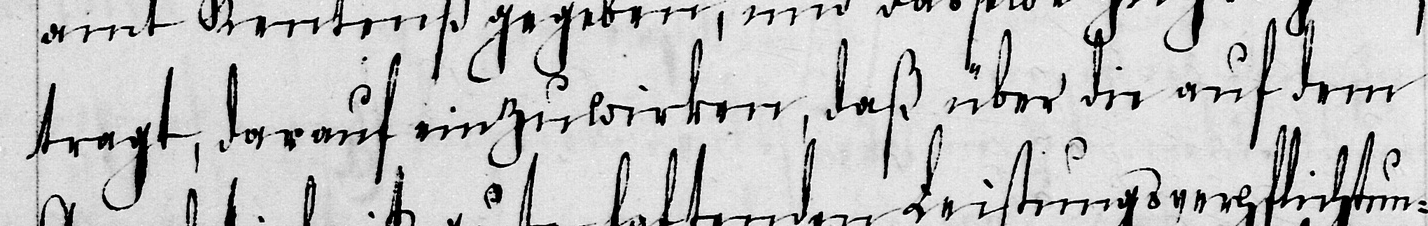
tragt, darauf einzuwirken, daß über die auf dem
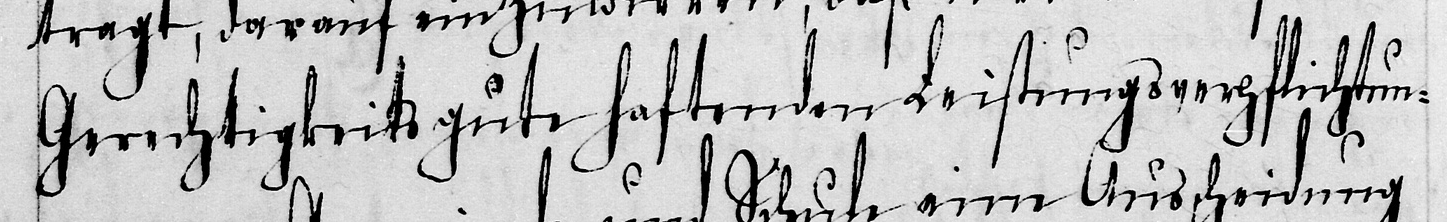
Gerechtigkeitsgute haftenden Leistungsverpflichtu¬
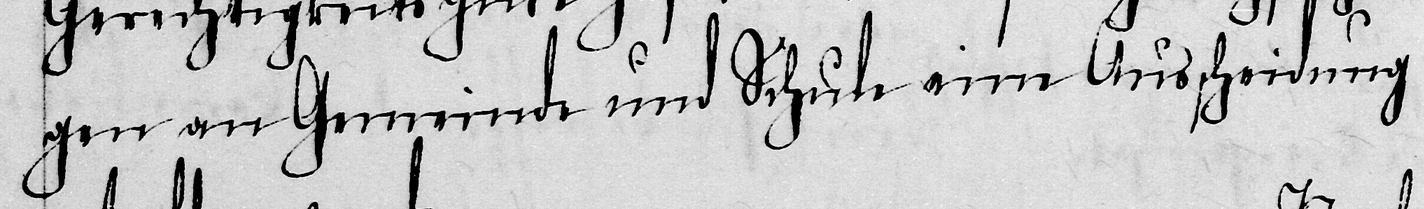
ngen an Gemeinde und Schule eine Ausscheidung
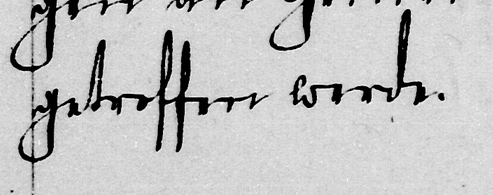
getroffen werde.
